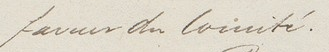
faveur du Comité.
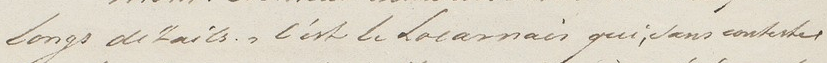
longs détails. – C'est le Locarnais qui, sans contester
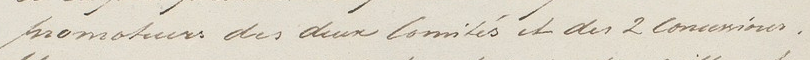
promoteurs des deux Comités et des 2 Concessions.
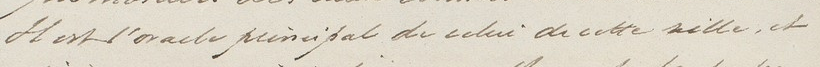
Il est l'oracle principal de celui de cette ville, et
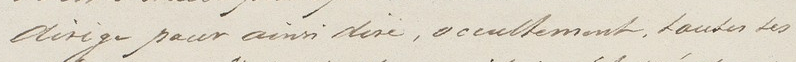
dirige pour ainsi dire, occultement, toutes les
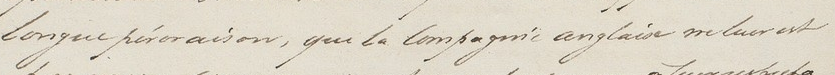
longue péroraison, que la Compagnie anglaise ne leur est
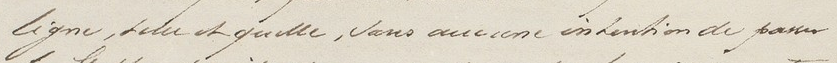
ligne, telle et quelle, sans aucune intention de passer
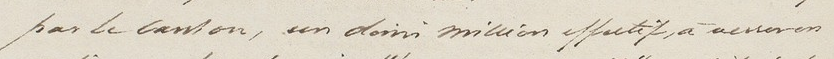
par le canton, un demi million effectif, à verser en
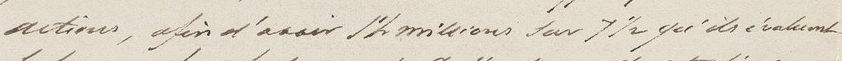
actions, afin d'avoir 1½ millions sur 7½ qu'ils évaluent
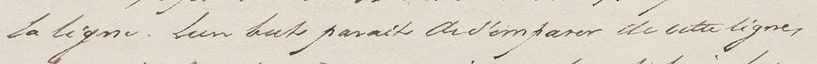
la ligne. Leur but parait de s'emparer de cette ligne,
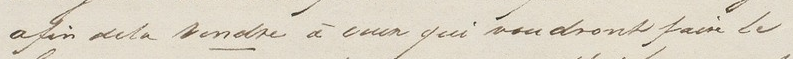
afin dela vendre à ceux qui voudront faire le
